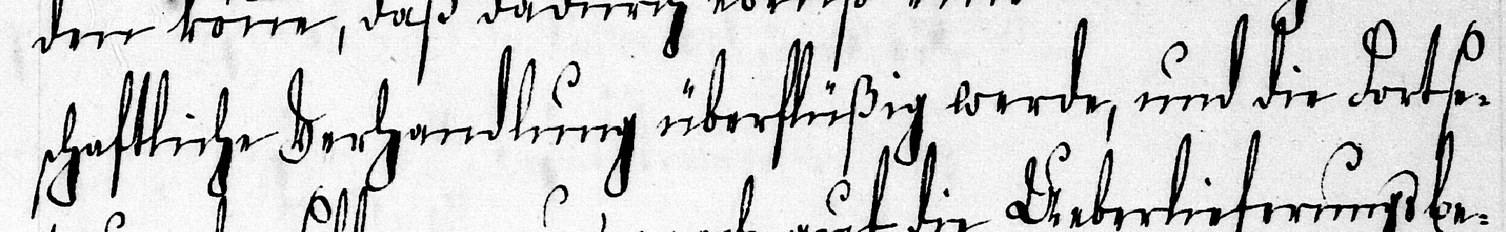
chaftliche Verhandlung überflüßig werde, und die Fortse¬
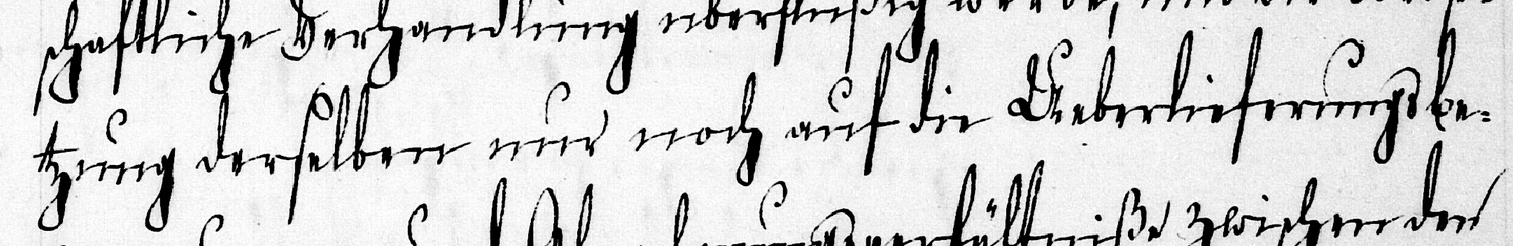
tzung derselben nur noch auf die Ueberlieferungsbe¬
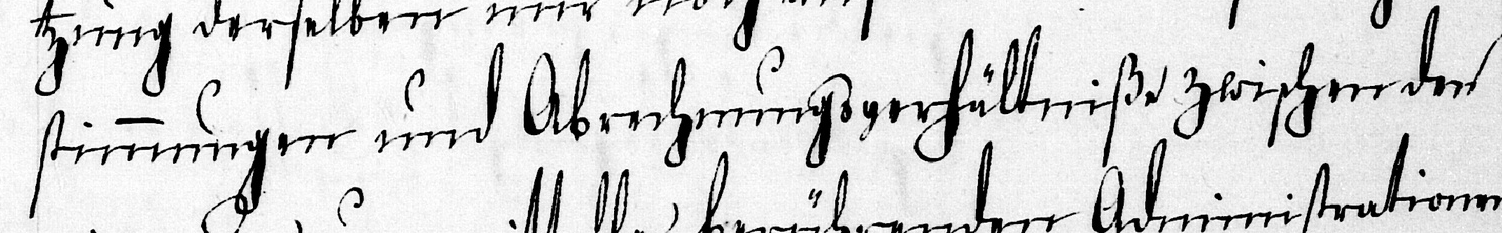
stimmungen und Abrechnungsverhältniße zwischen den
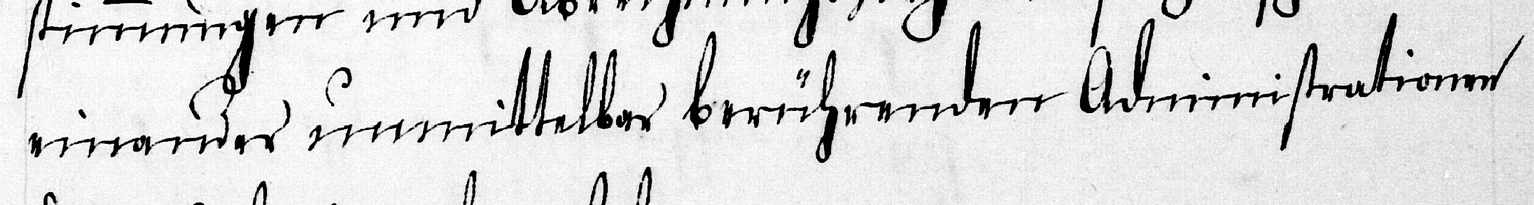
einander unmittelbar berührenden Administrationen
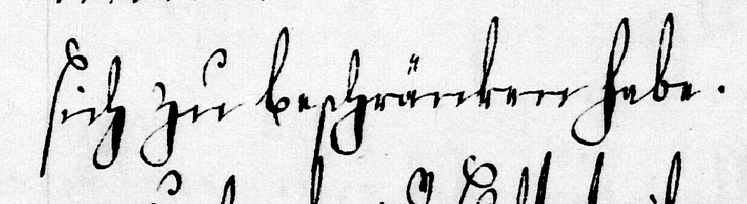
sich zu beschränken habe.
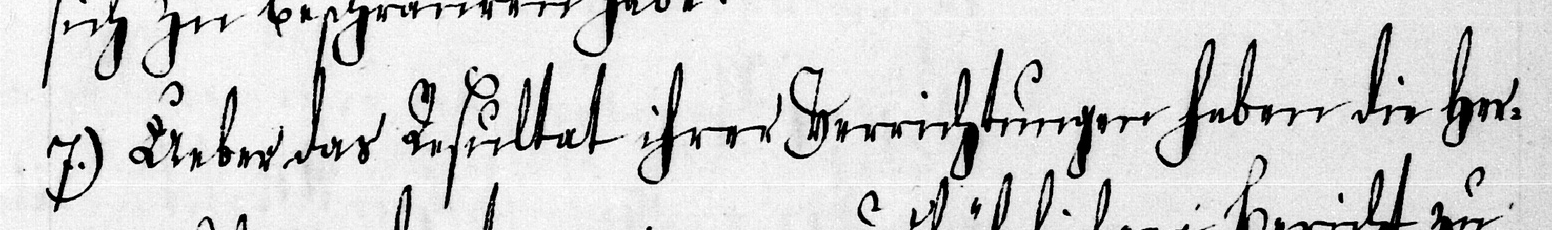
7.) Ueber das Resultat ihrer Verrichtungen haben die Her¬
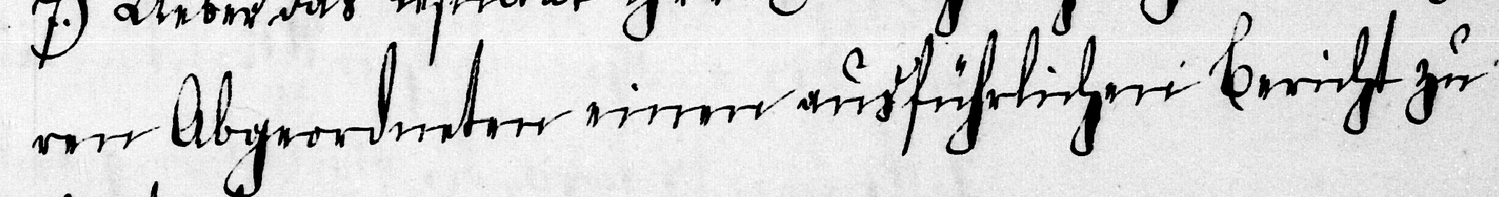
ren Abgeordneten einen ausführlichen Bericht zu
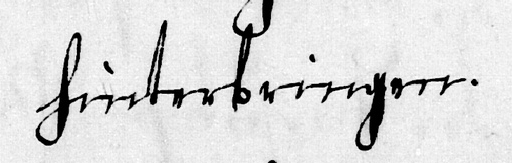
hinterbringen.
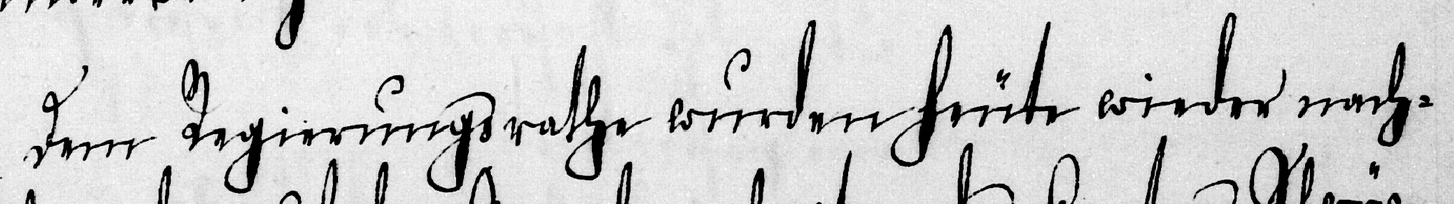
Dem Regierungsrathe wurden heute wieder nach¬
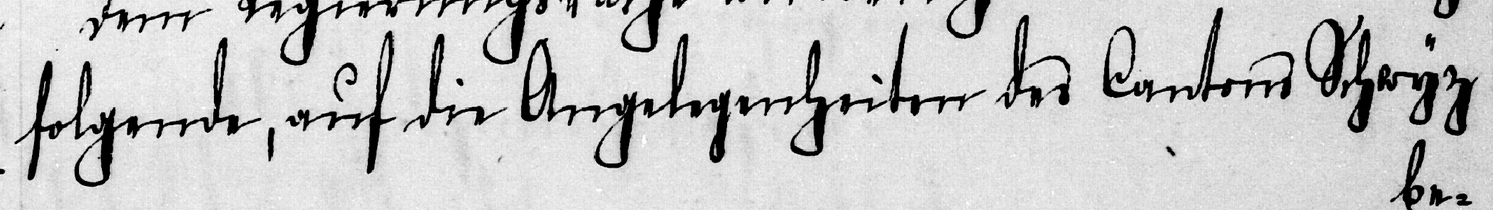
folgende, auf die Angelegenheiten des Cantons Schwyz
